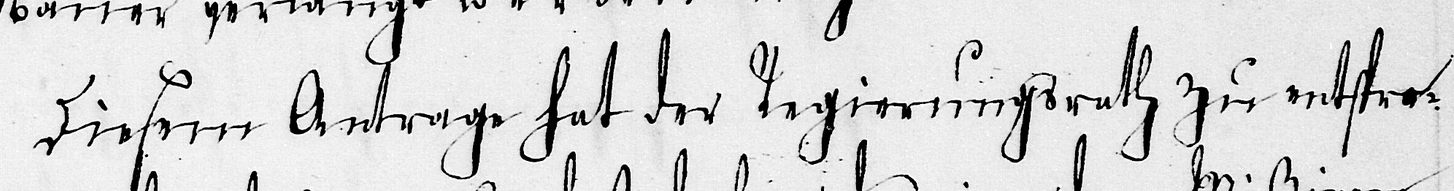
Diesem Antrage hat der Regierungsrath zu entspre¬
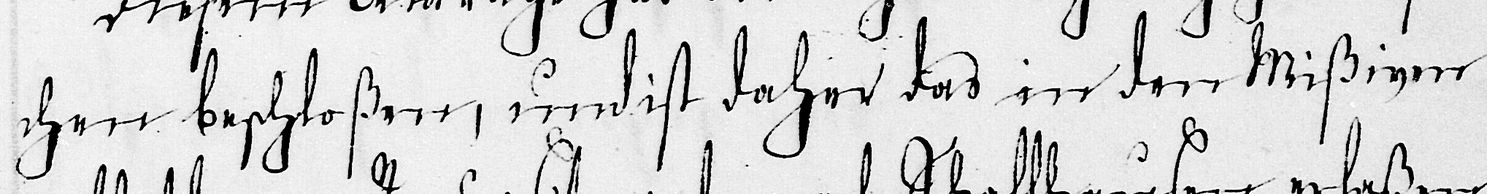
chen beschloßen, und ist daher das in den Mißiven
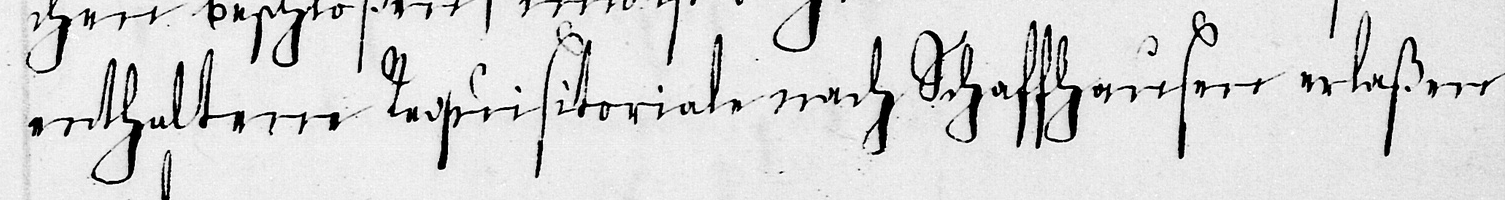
enthaltene Requisitoriale nach Schaffhausen erlaßen
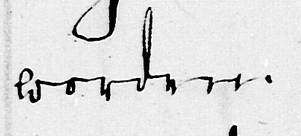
worden.
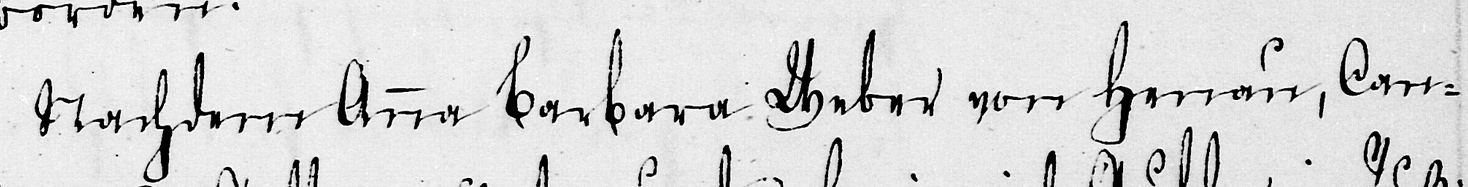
Nachdem Anna Barbara Weber von Henau, Can¬
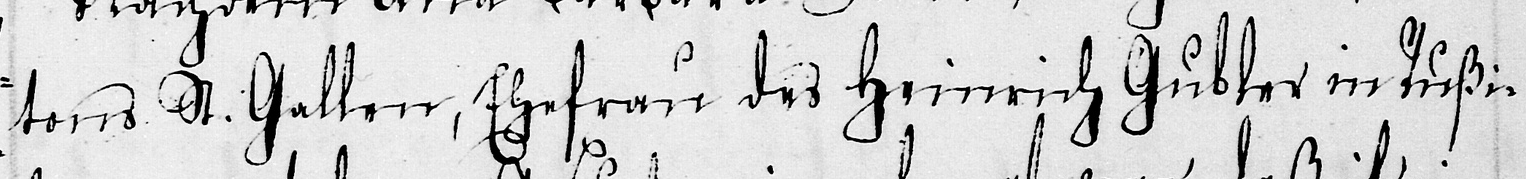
tons St. Gallen, Ehefrau des Heinrich Gubler in Rußi¬
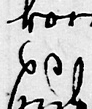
d. M.
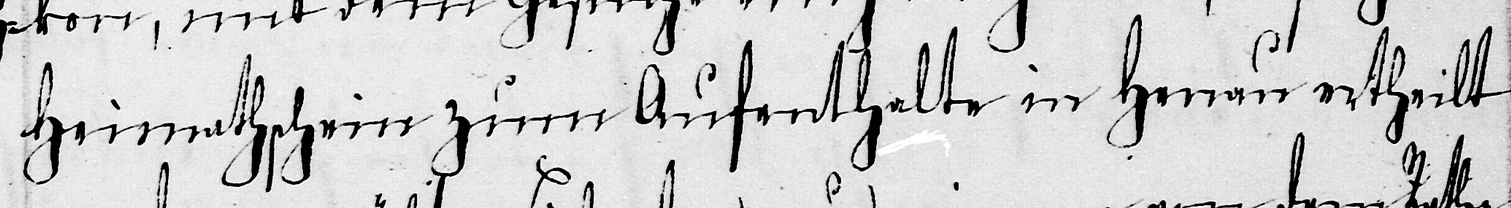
Heimathschein zum Aufenthalte in Henau ertheilt
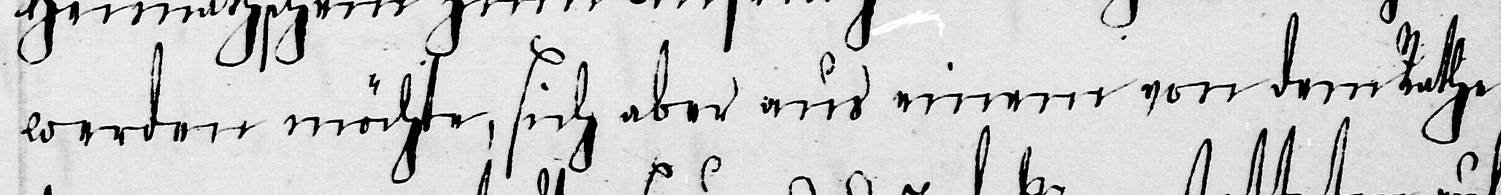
werden möchte, sich aber aus einem von dem Rathe
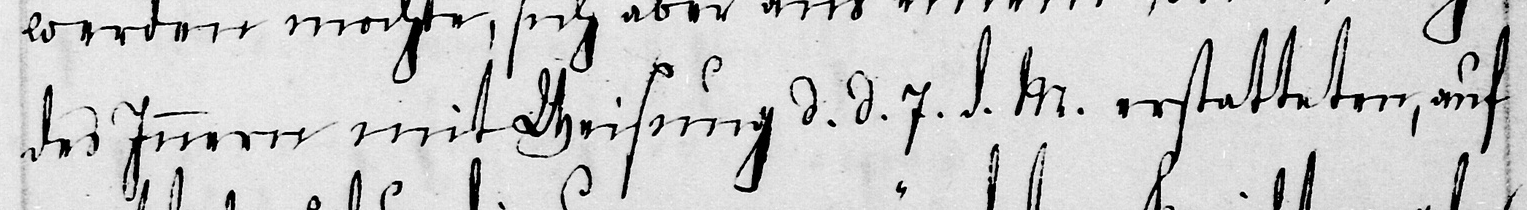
des Innern mit Weisung d. d. 7. d. M. erstatteten, auf
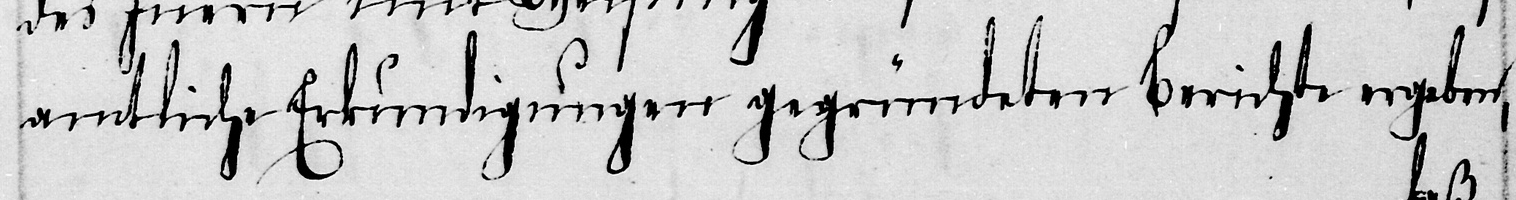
amtliche Erkundigungen gegründeten Berichte ergeben,
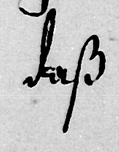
daß
